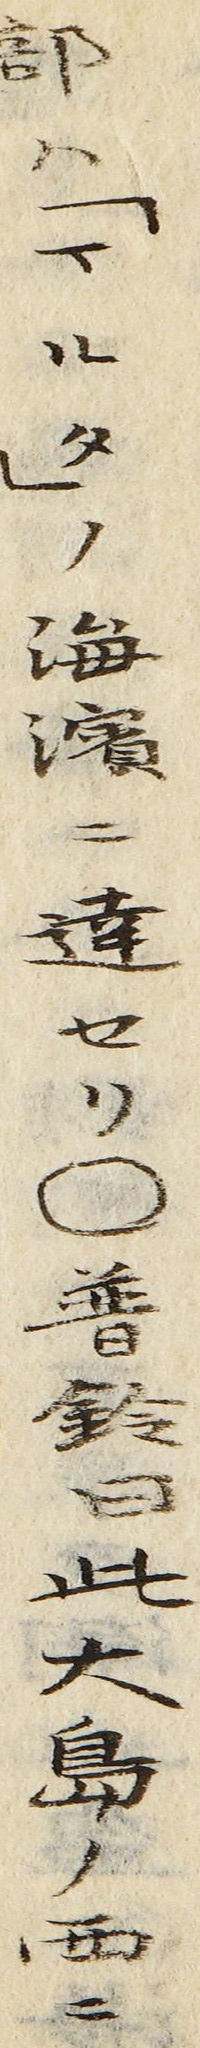部ハ「マルタ」ノ海浜ニ達セリ◯普鈴曰此大島ノ西ニ
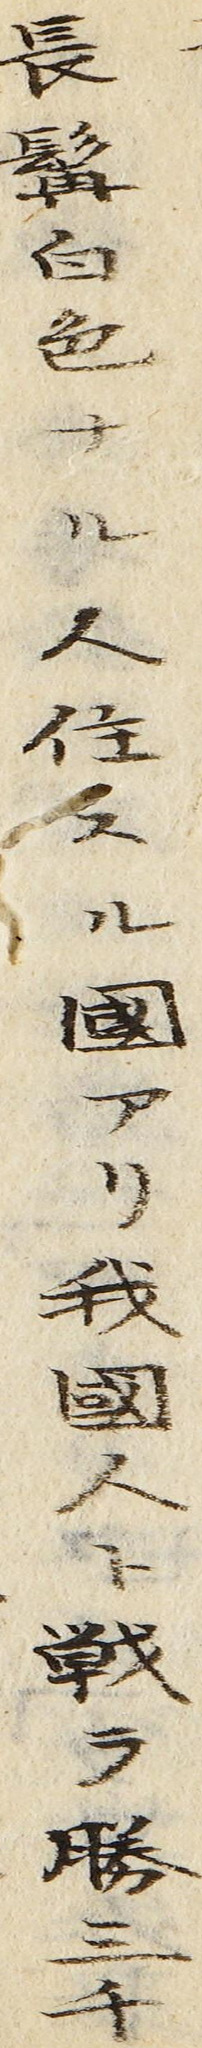長髯白色ナル人住スル国アリ我国人ト戦テ勝三千
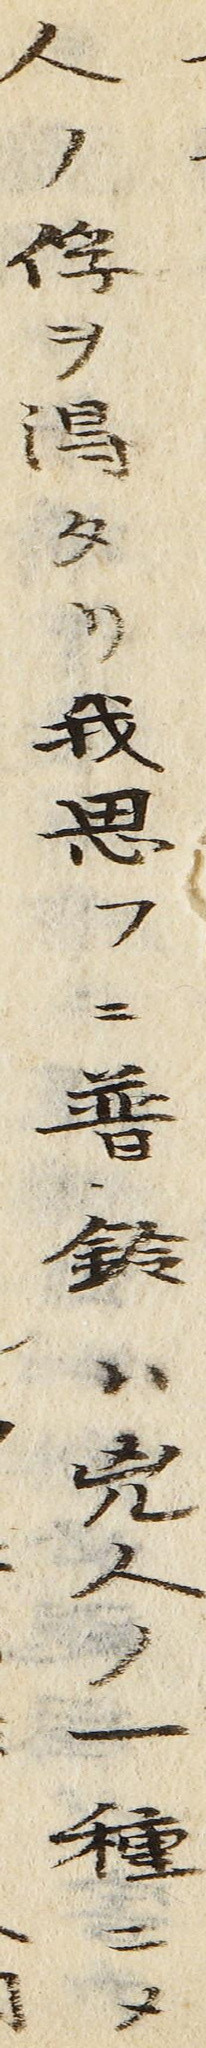人ノ俘ヲ得タリ我思フニ普鈴ハ兇人ノ一種ニシテ
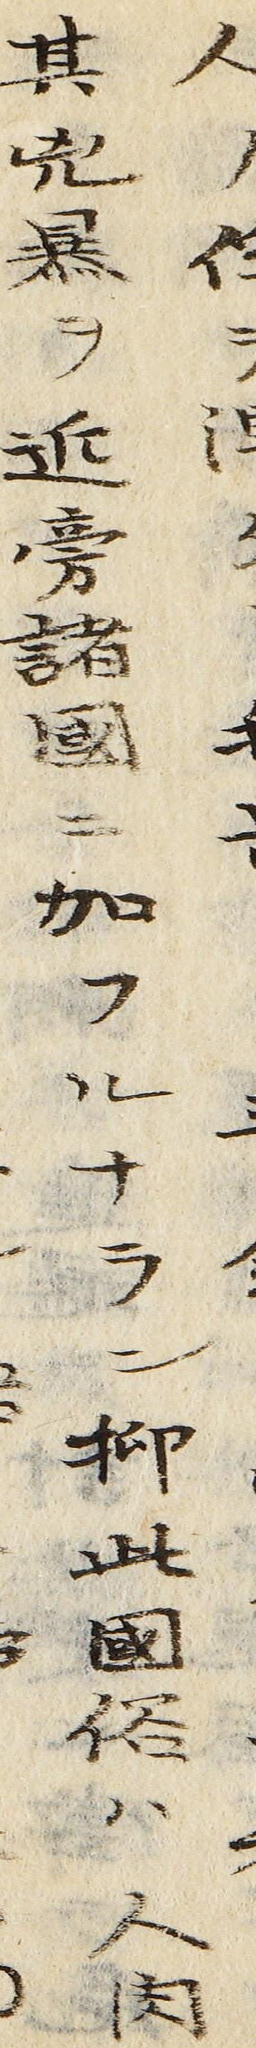其兇暴ヲ近旁諸国ニ加フルナラン抑此国俗ハ人肉
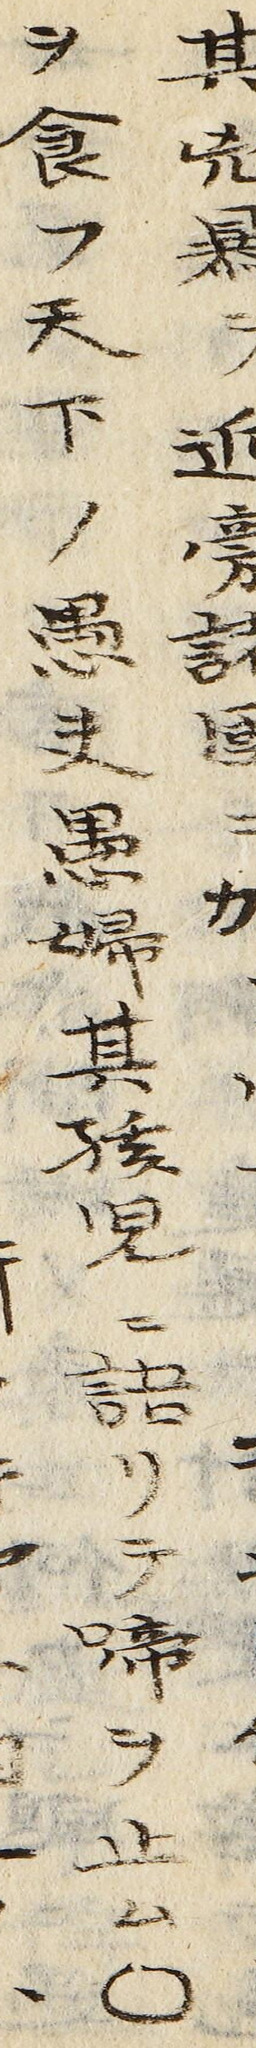ヲ食フ天下ノ愚夫愚婦其孩児ニ語リテ啼ヲ止ム◯
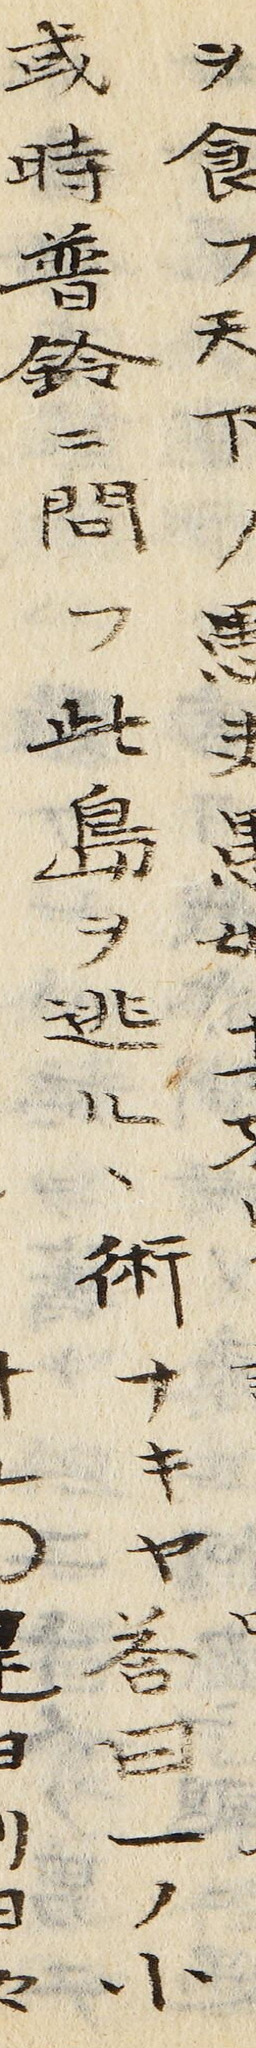或時普鈴ニ問フ此島ヲ逃ルヽ術ナキヤ答曰一ノ小
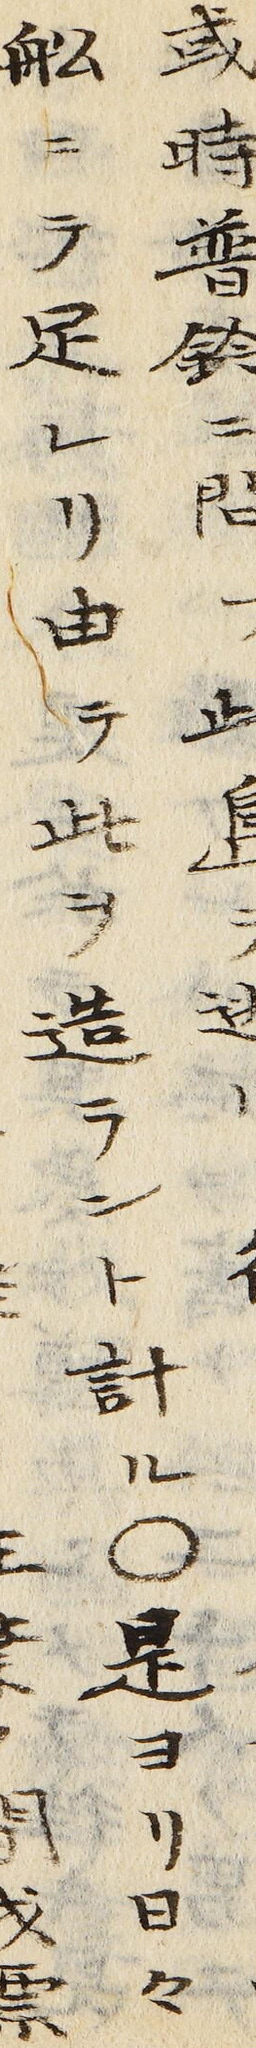船ニテ足レリ由テ此ヲ造ラント計ル◯是ヨリ日々
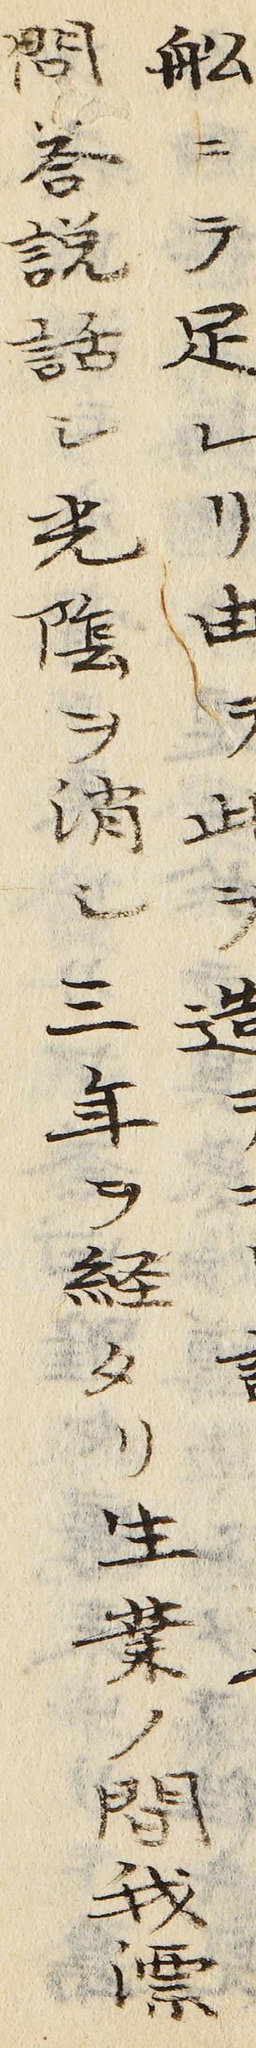問答説話シ光陰ヲ消シ三年ヲ経タリ生業ノ間我漂
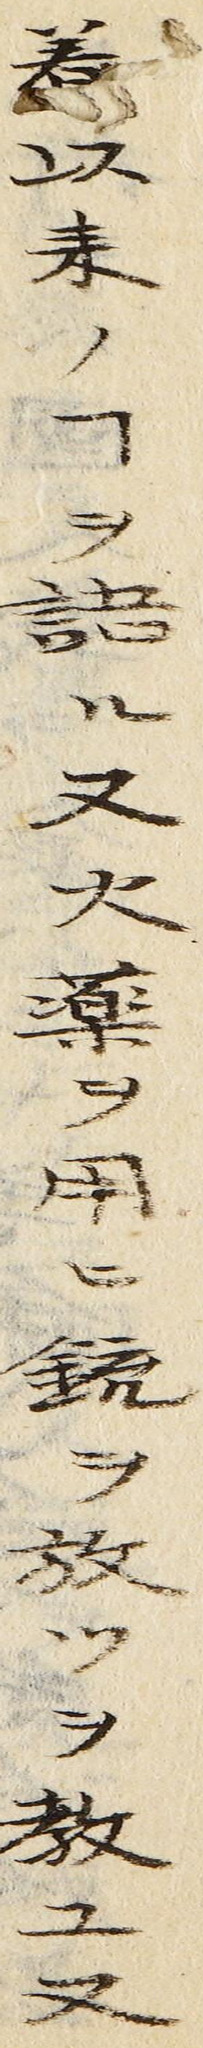着以来ノコトヲ語ル又火薬ヲ用ヒ銃ヲ放ツヲ教ユ又
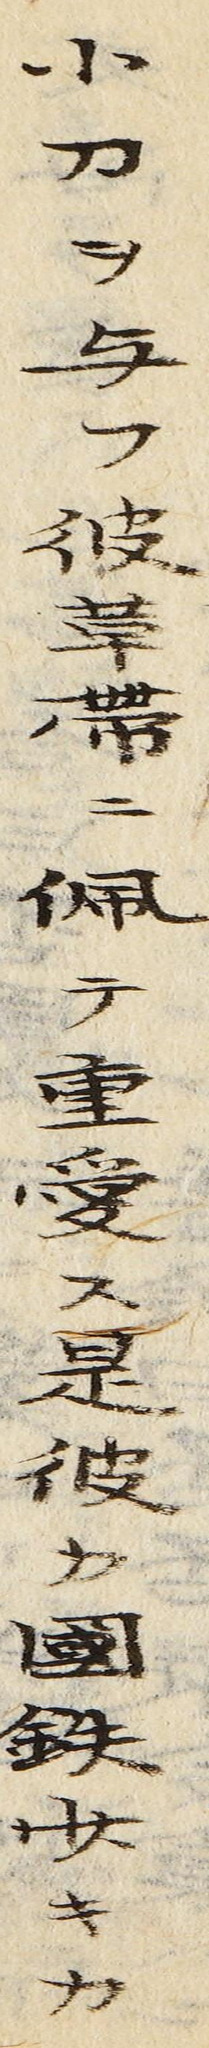小刀ヲ与フ彼革帯ニ佩テ重愛ス是彼カ国鉄少キカ
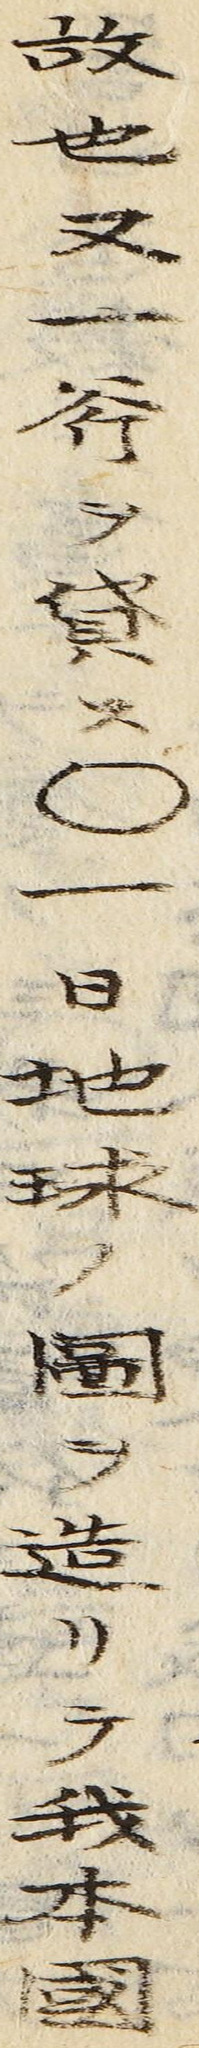故也又一斧ヲ貸ス◯一日地球ノ図ヲ造リテ我本国
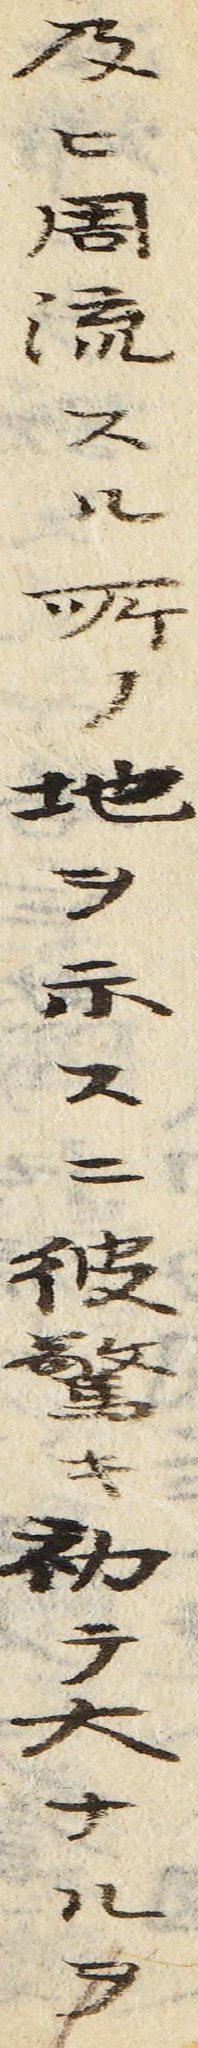及ヒ周流スル所ノ地ヲ示スニ彼驚キ初テ大ナルヲ
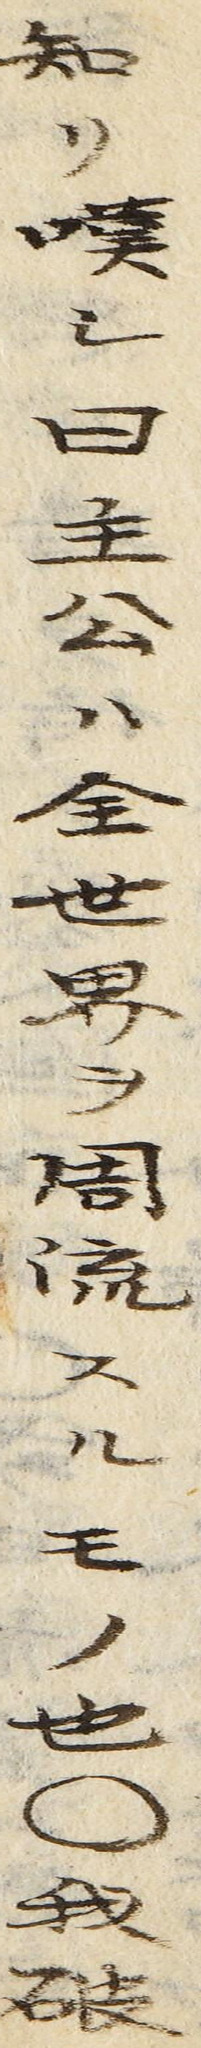知リ嘆シ曰主公ハ全世界ヲ周流スルモノ也◯我破
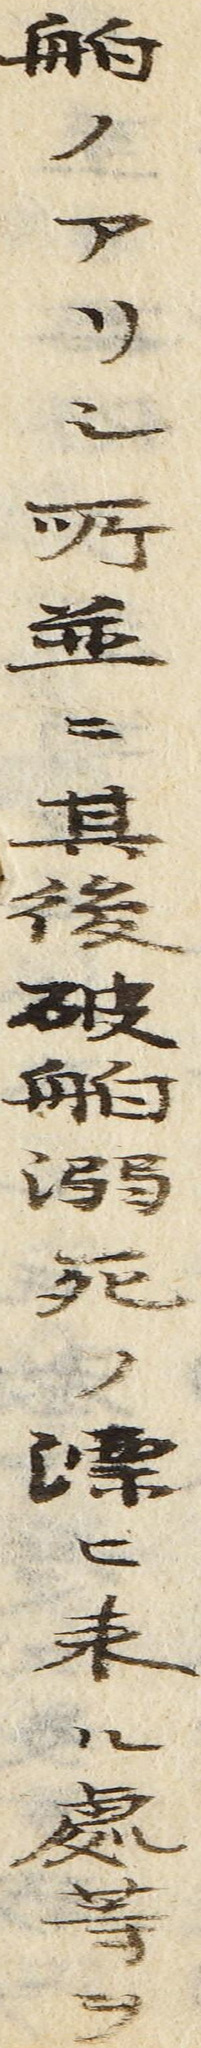舶ノアリシ所並ニ其後破舶溺死ノ漂ヒ来ル処等ヲ
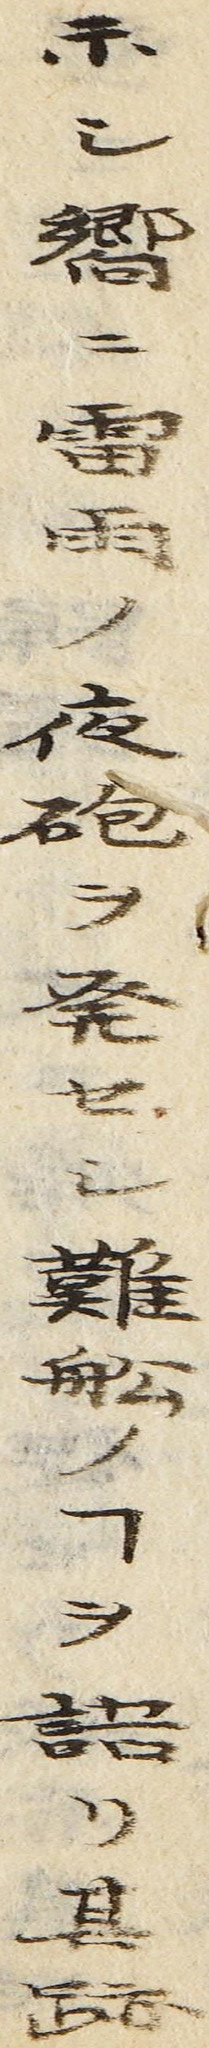示シ嚮ニ雷雨ノ夜砲ヲ発セシ難船ノコトヲ語リ其跡
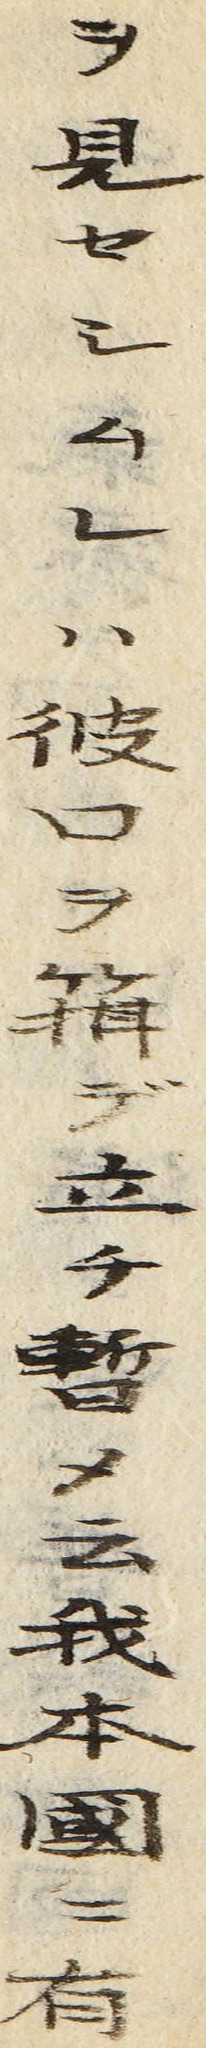ヲ見セシムレハ彼口ヲ箝デ立チ暫シテ云我本国ニ有
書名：漂流紀事
